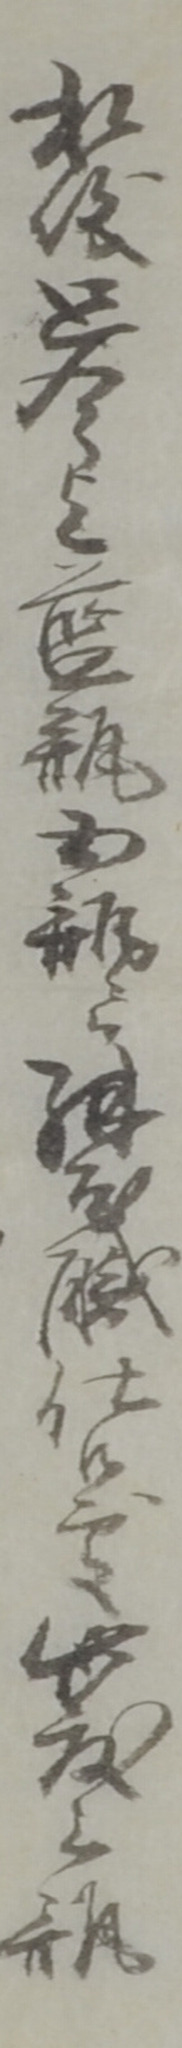私儀只今迄藍瓶五瓶ニ而紺屋職仕候處此度三瓶
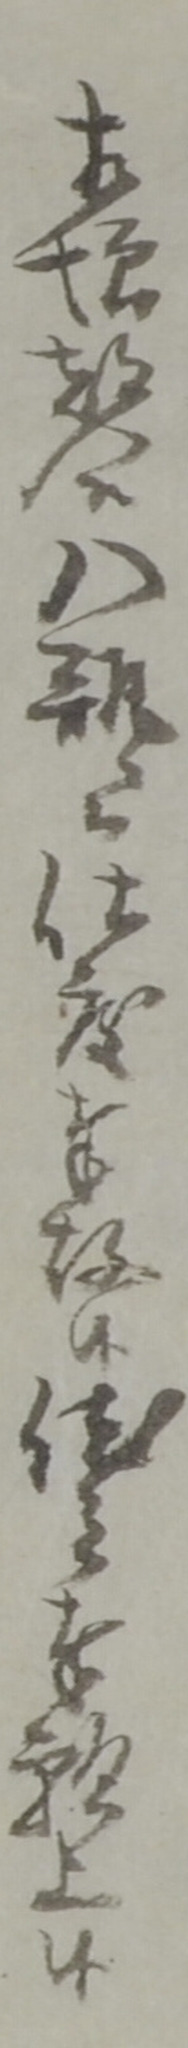相増都合八瓶ニ而仕度奉存候依之奉願上候
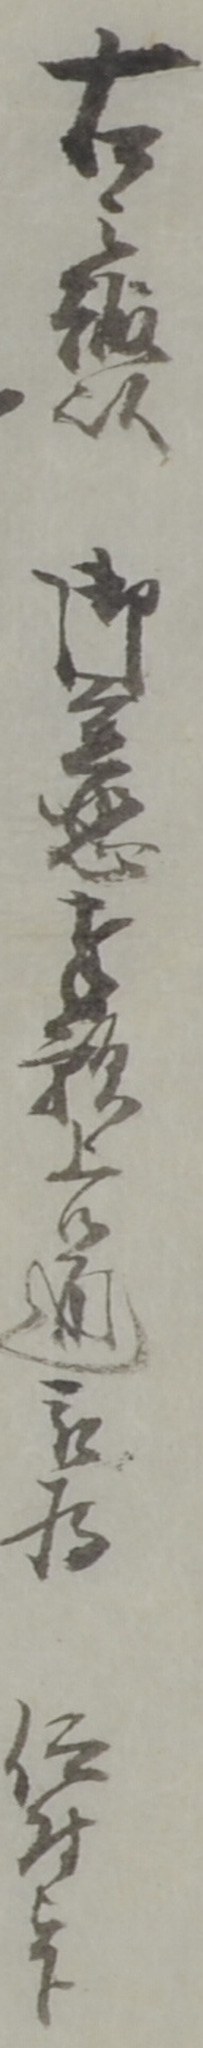右之趣以御慈悲奉願上候通被為仰付被下
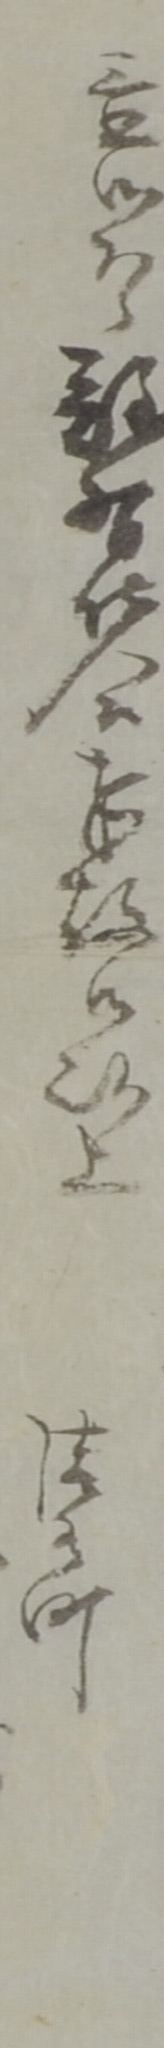置候ハヽ難有仕合奉存候以上清水町
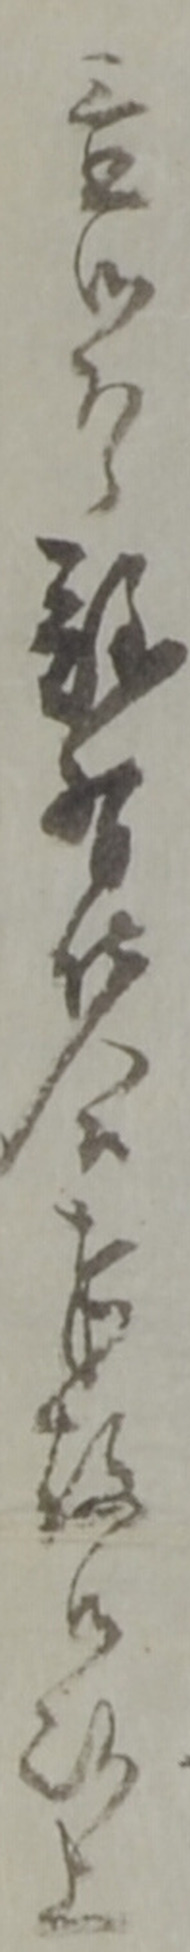被下置候ハヽ難有仕合奉存候以上
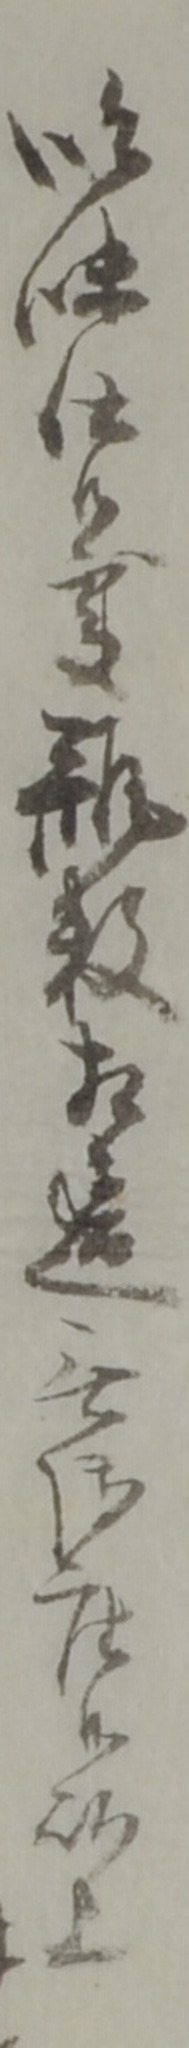吟味仕候處瓶数相違無御座候以上
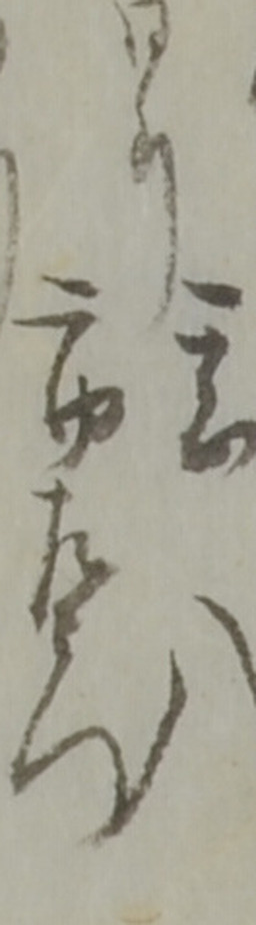市左衛門
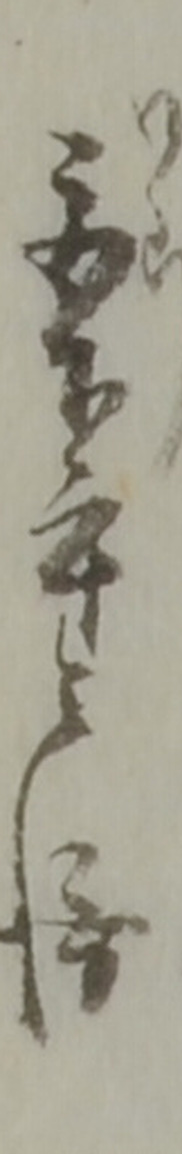宮下平兵衛
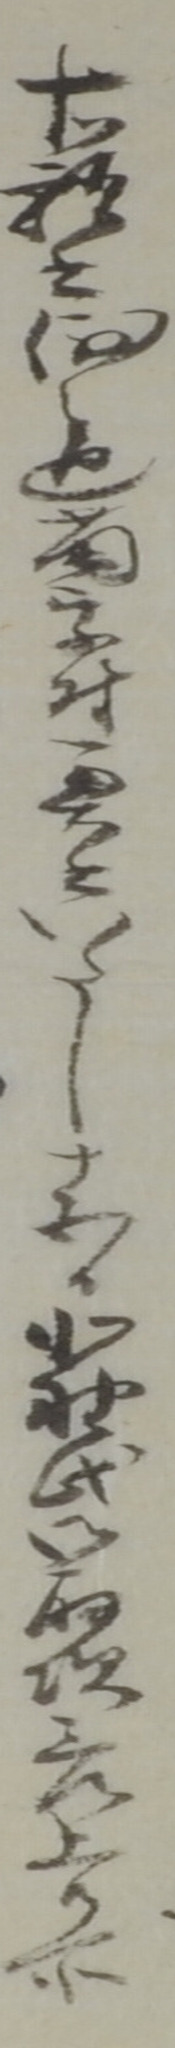右願書渡し廻苗字付奥書いたし十五日北野氏御取次差上候所
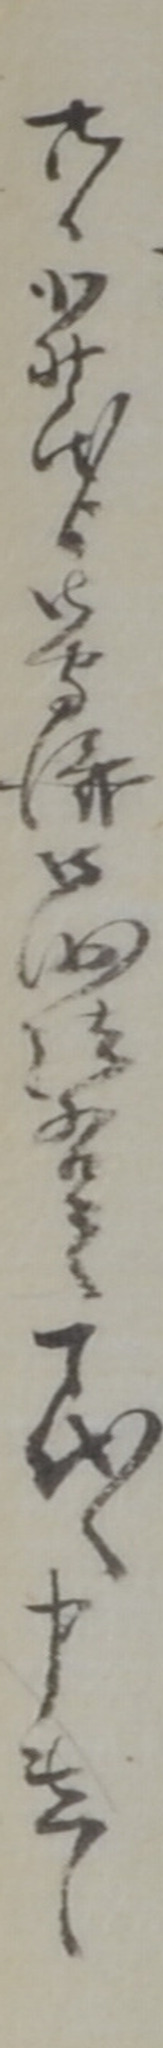廿日北野氏ゟ御聞済御沙汰有之丁代へ申渡候
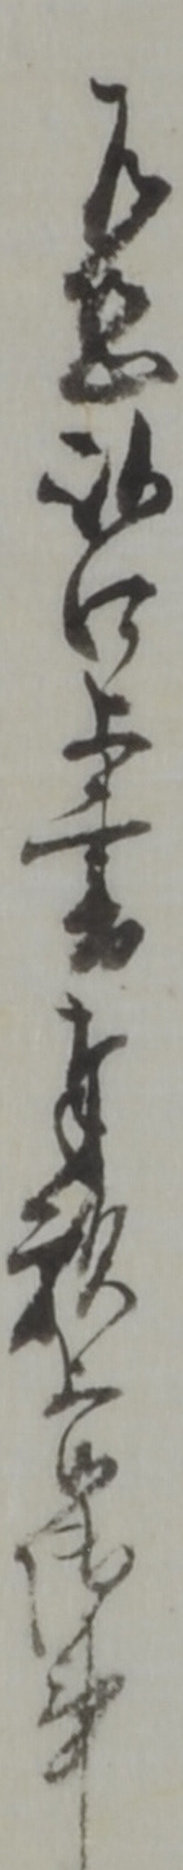乍恐以口上書奉願上候御事
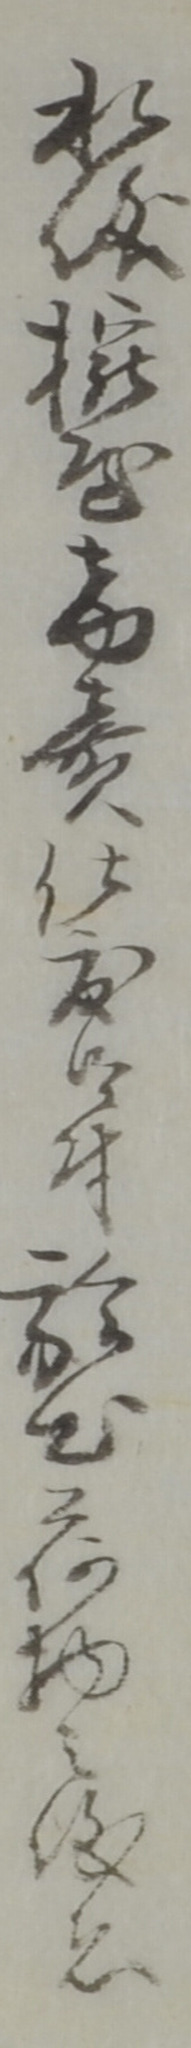私儀椀屋商売仕度候ニ付放出荷物之儀者
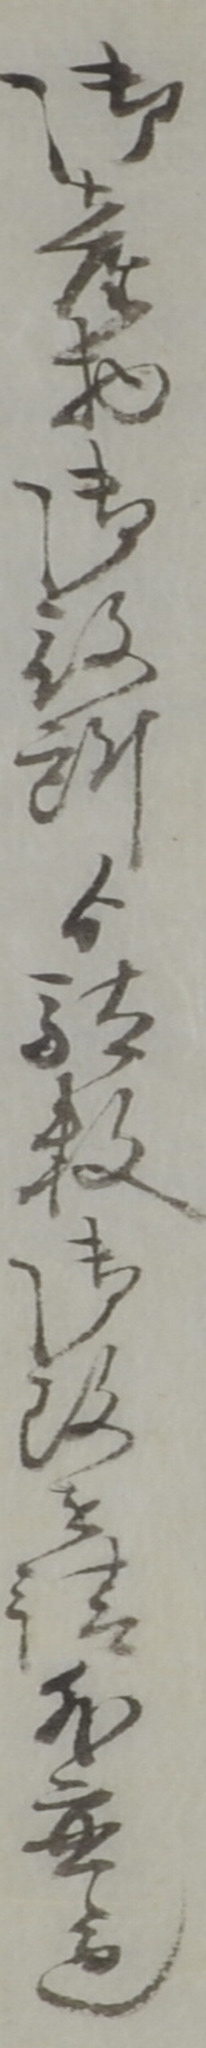御産物御役所ゟ請数御改を請外並之通
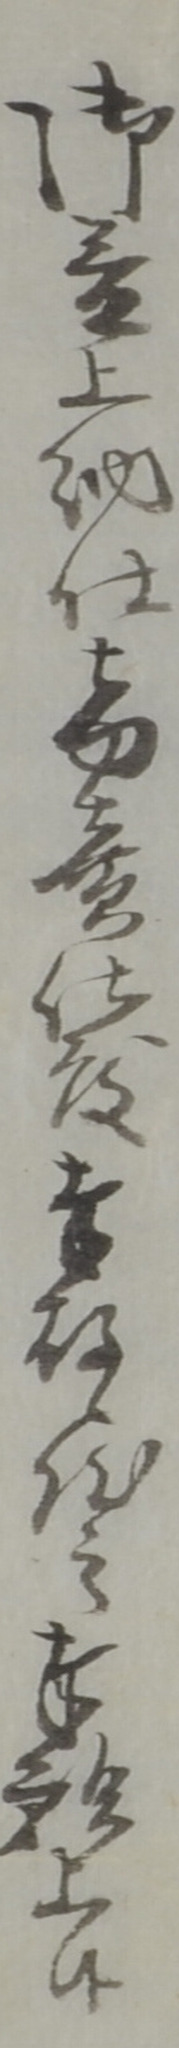御益上納仕商売仕度奉存仕候依之奉願上候
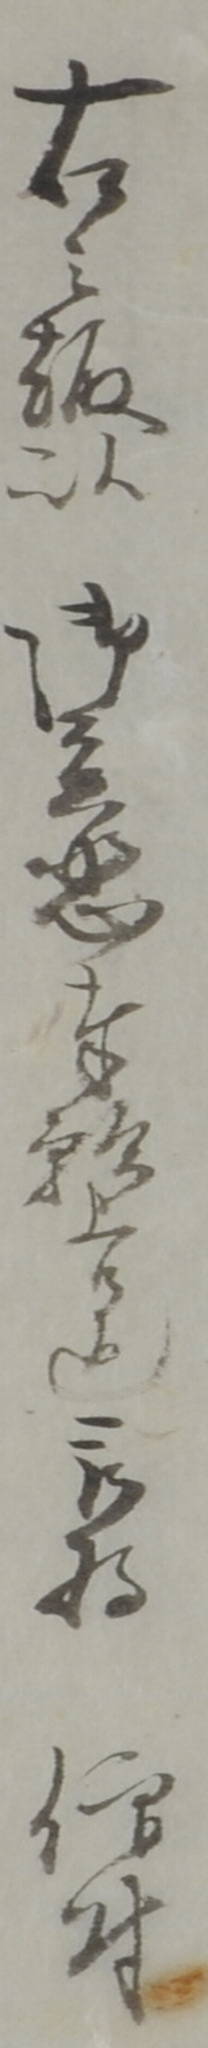右之趣以御慈悲奉願上候通被為仰付
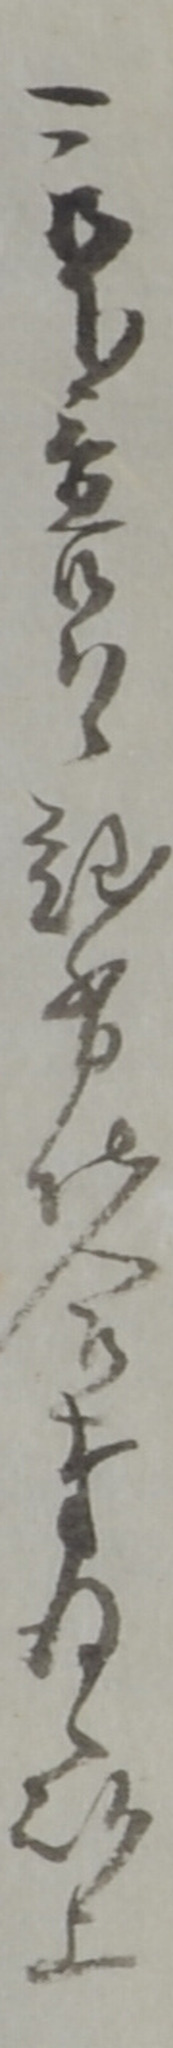被下置候ハヽ難有仕合奉存候以上
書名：諸願書控簿
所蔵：伊那市立高遠町図書館・合同会社AMANE
